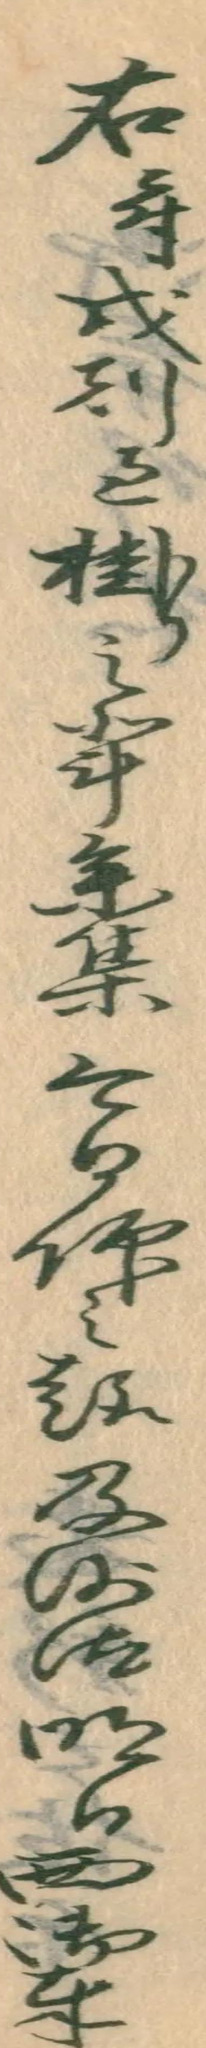一右ニ付戌刻過掛り之輩参集今日仰之趣及沙汰明日西御奉
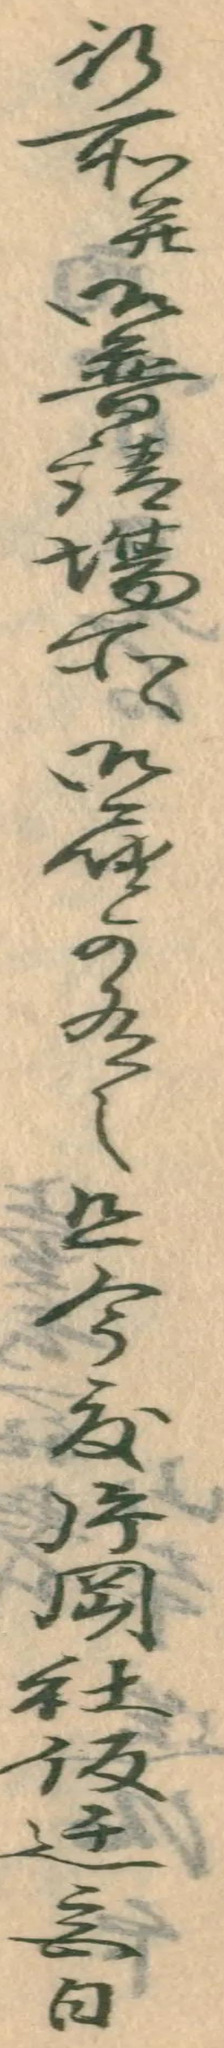行所并御普請場所へ御届可有之且今度片岡社仮迁宮日
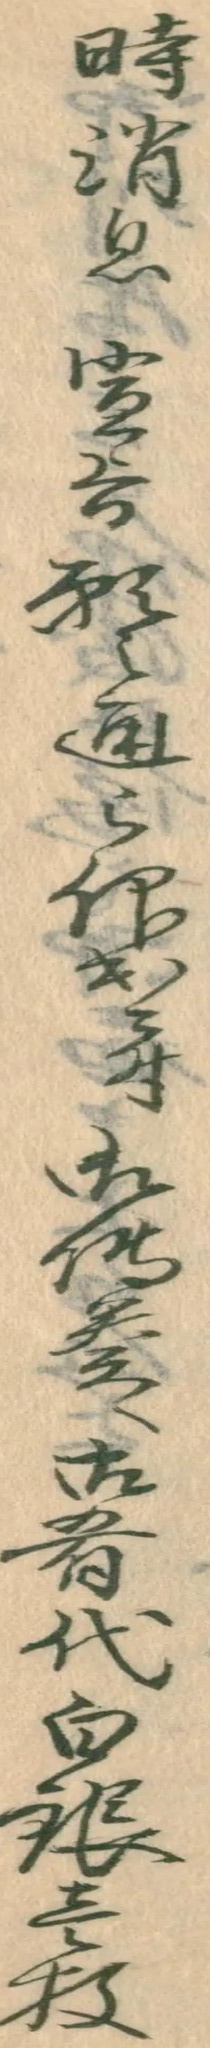時消息宣旨願之通被仰出ニ付御伝奏へ御肴代白銀壱枚
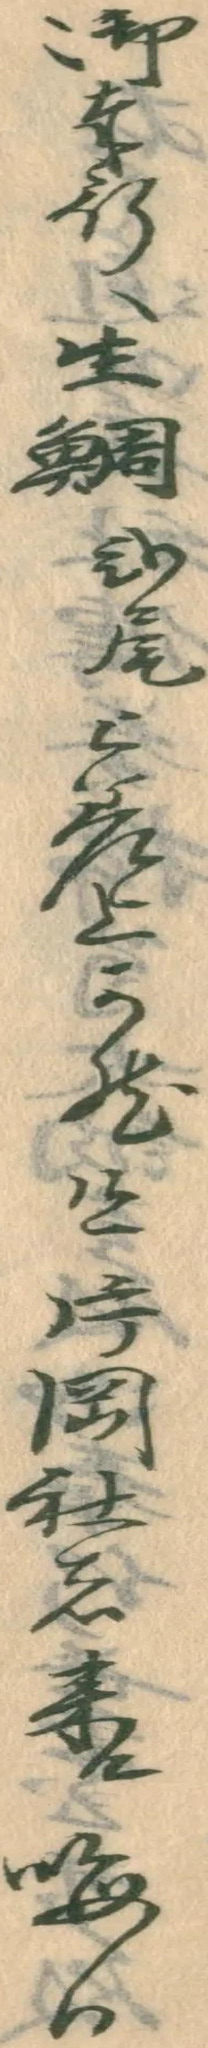御奉行へ生鯛弐尾被差上可然且片岡社は来ル晦日
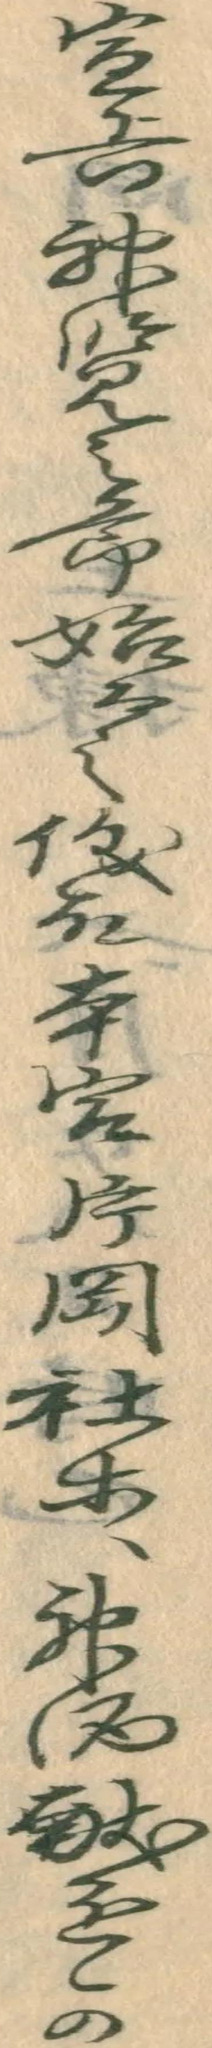宣旨神覧之節始而之儀故本宮片岡社等へ神酒献進可
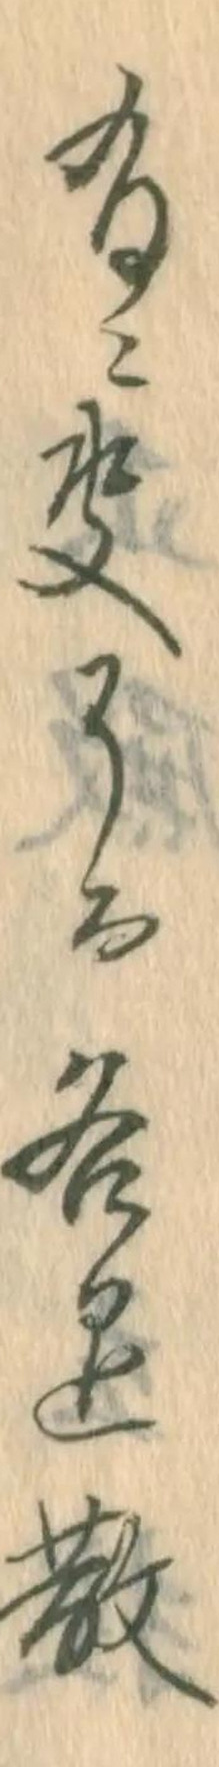有ニ決了而各退散
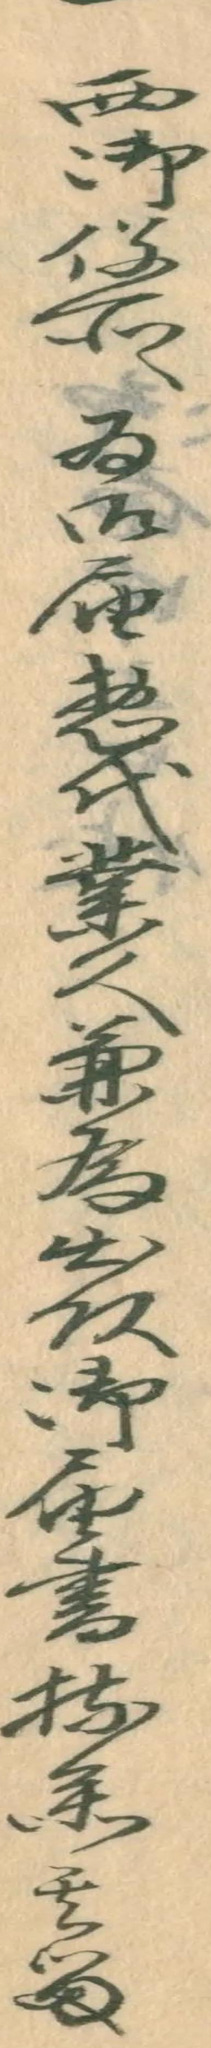一西御役所へ為御届惣代業久兼為出頭御届書持参其留

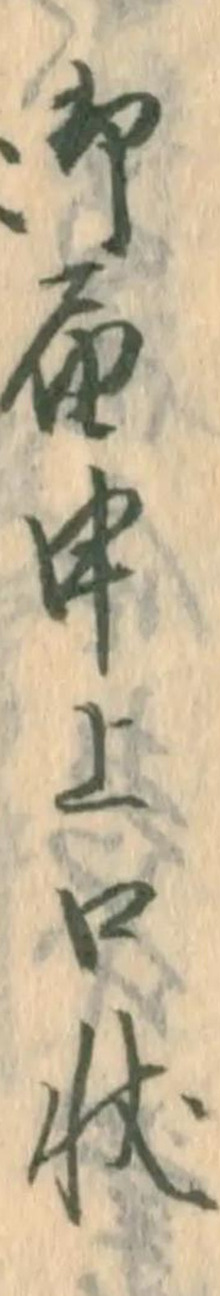御届申上口状
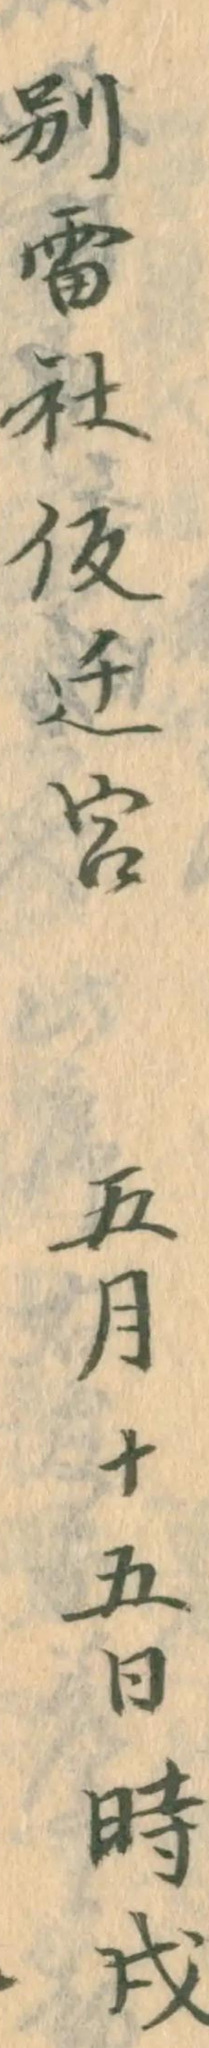別雷社仮迁宮五月十五日時戌
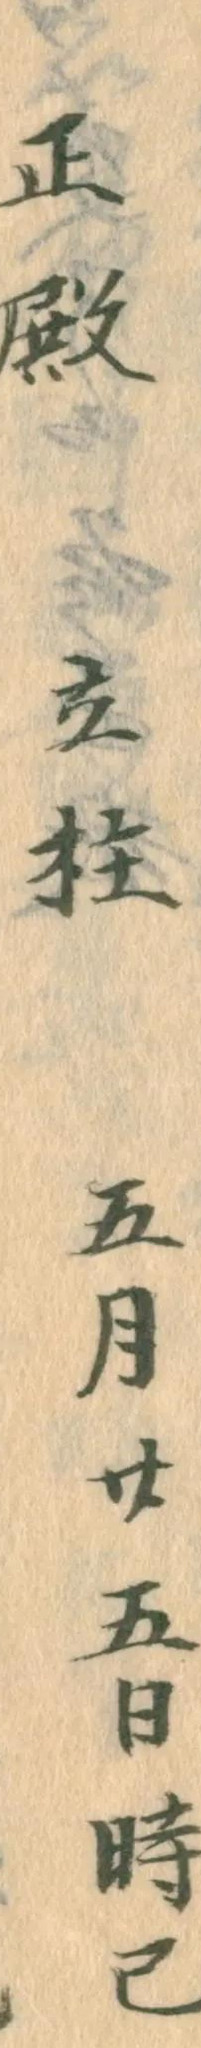正殿立柱五月廿五日時巳
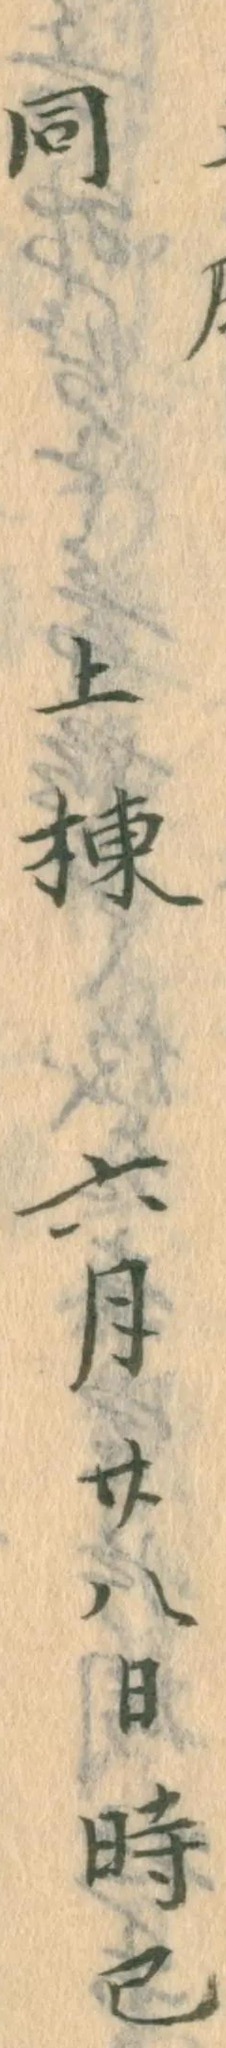同上棟六月廿八日時巳
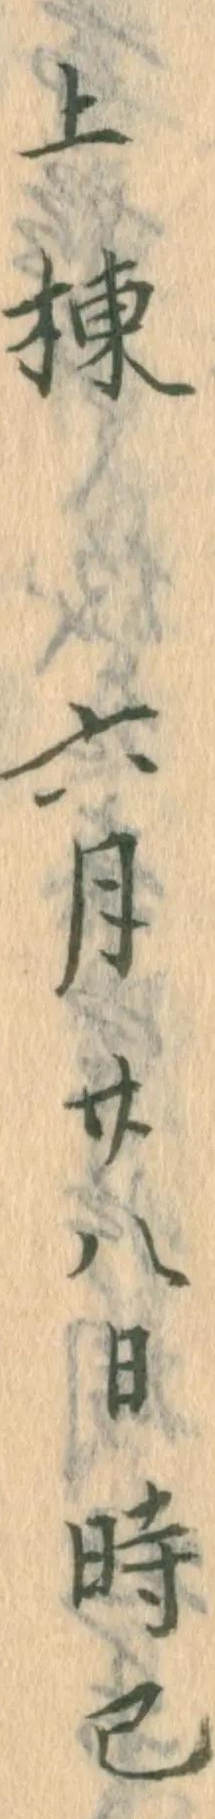同上棟六月廿八日時巳
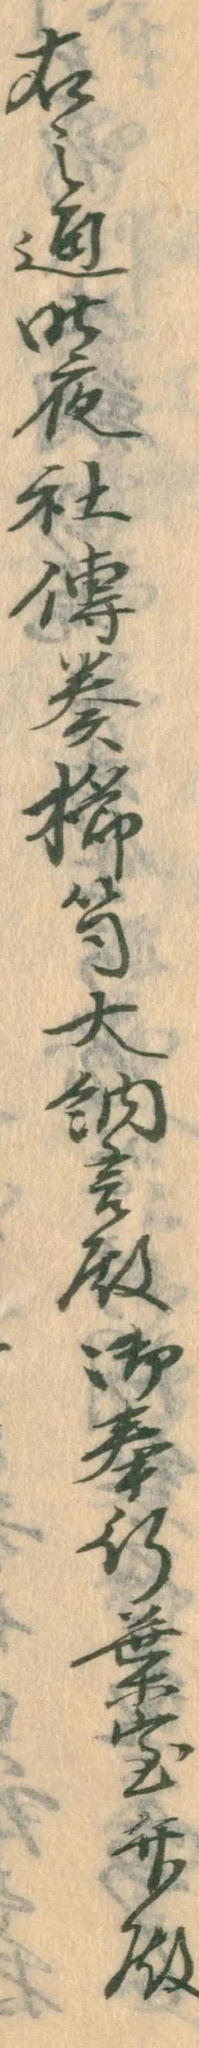右之通昨夜社伝奏櫛笥大納言殿御奉行葉室弁殿
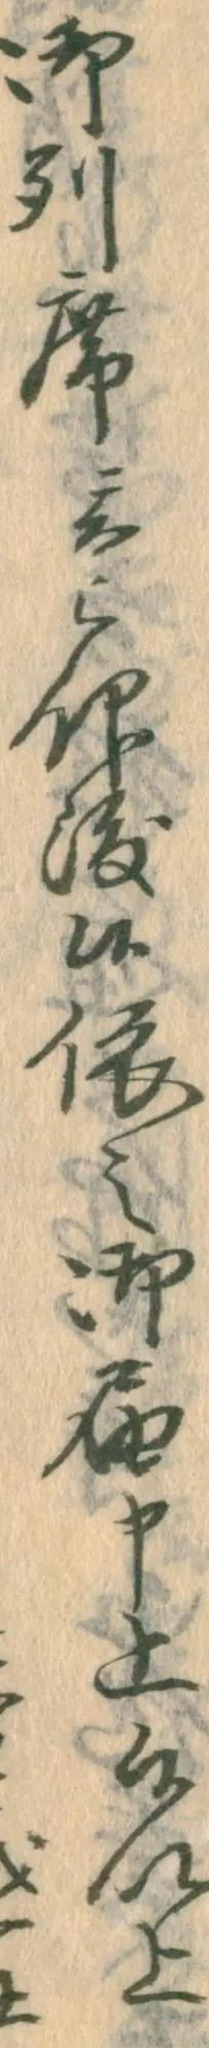御列席ニ而被仰渡候依之御届申上候以上
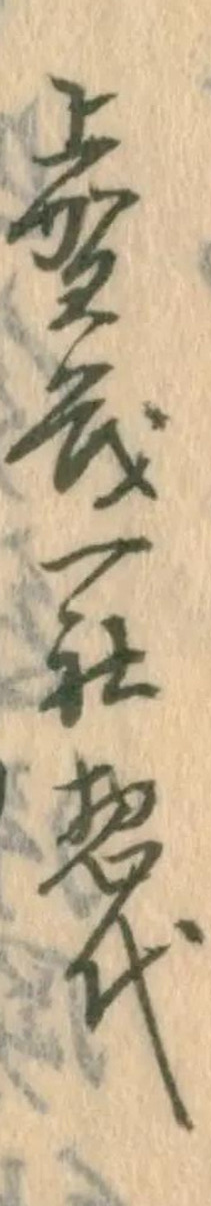上賀茂一社惣代
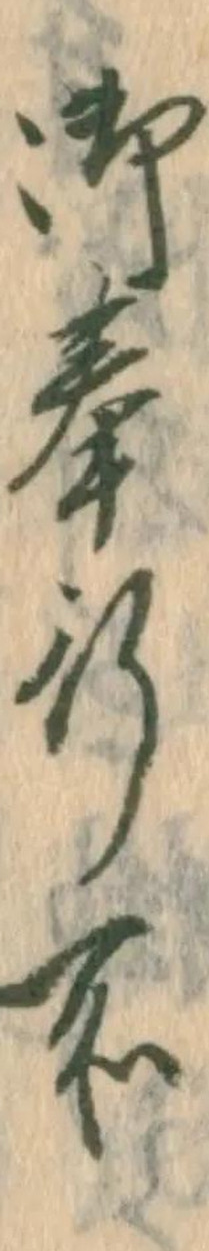御奉行所
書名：賀茂社記録. 第17冊
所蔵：国立国会図書館 National Diet Library, JAPAN
